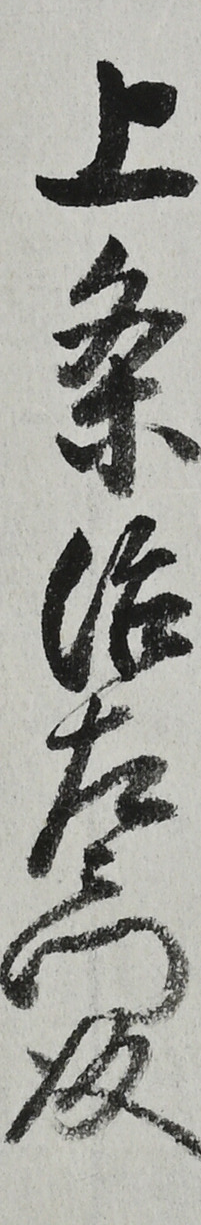上条治左衛門殿
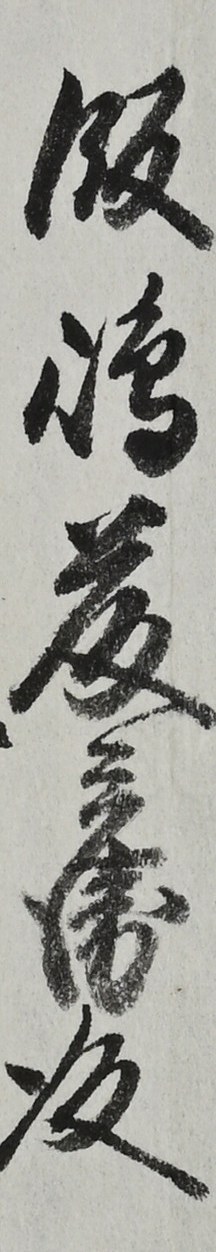飯嶋藤兵衛殿
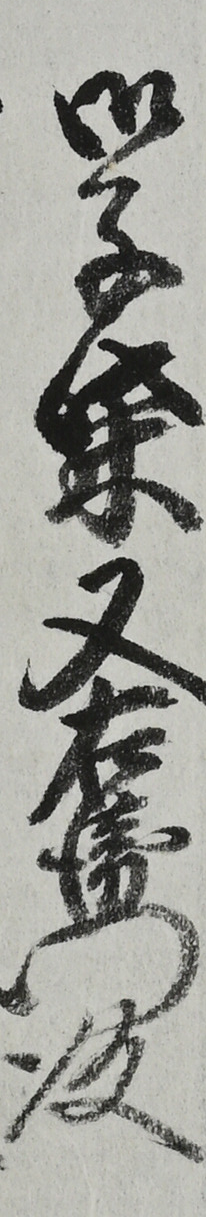御子柴又右衛門殿
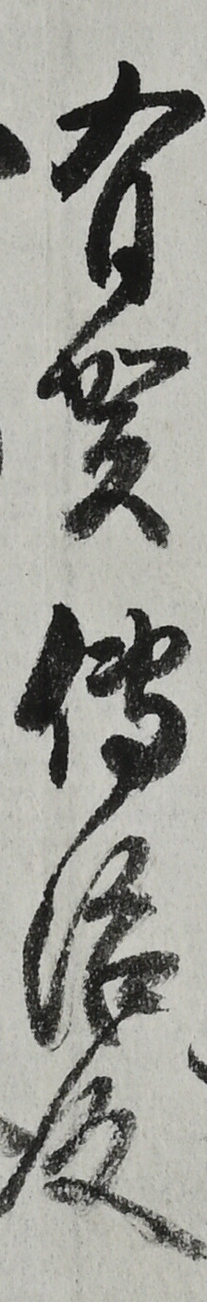有賀伝治殿
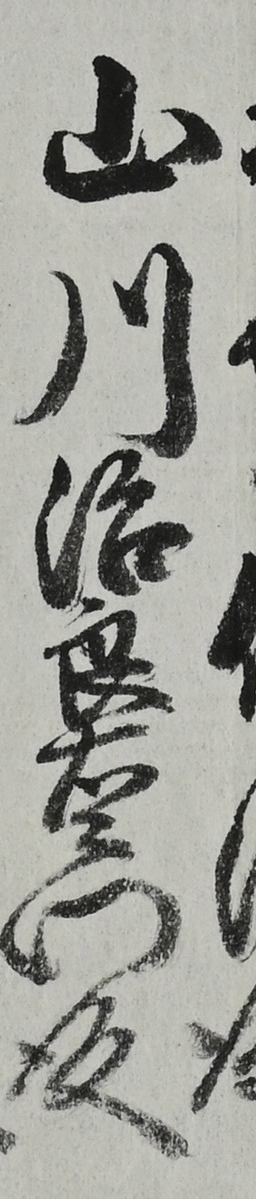山川治良右衛門殿
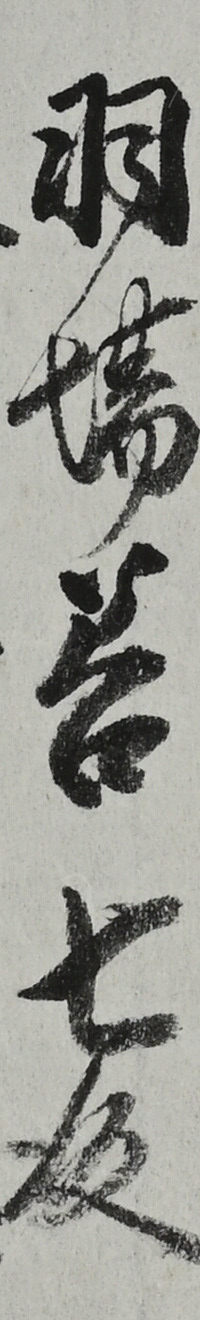羽場善七殿
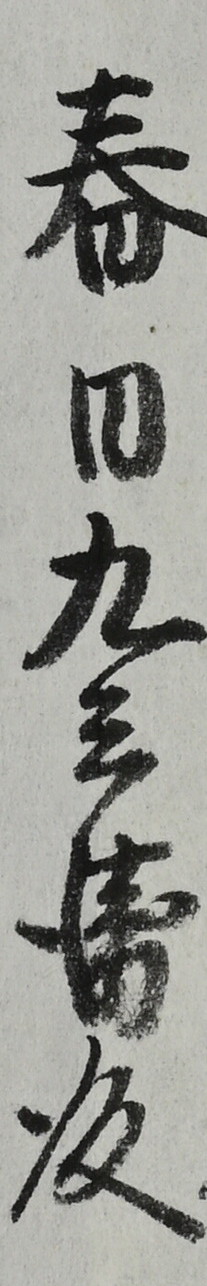春日久兵衛殿
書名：祭礼相撲四本柱土俵幷櫓太鼓免許
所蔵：伊那市立高遠町図書館・合同会社AMANE
